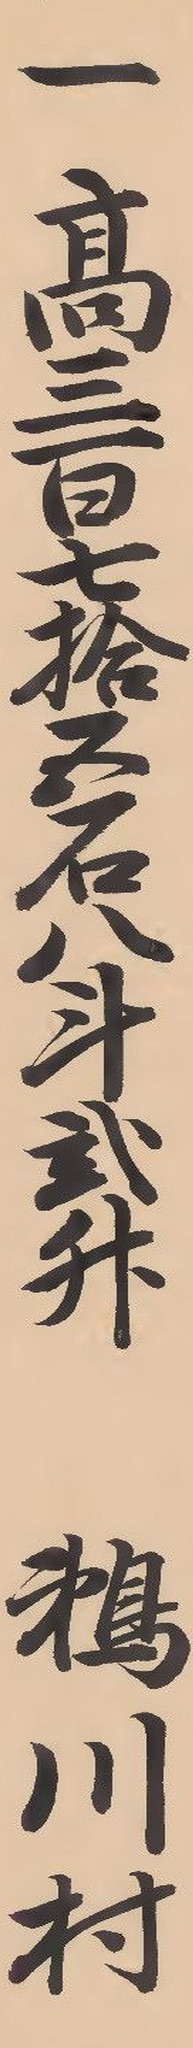一高三百七拾五石八斗弐升鵜川村
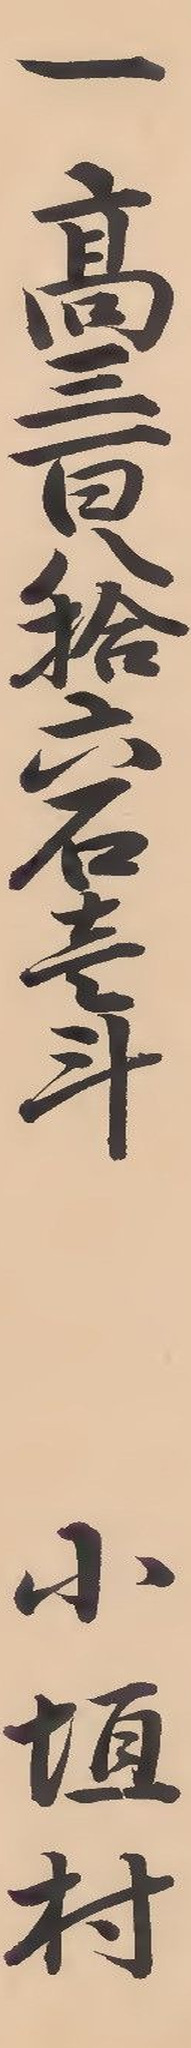一高三百八拾六石壱斗小垣村

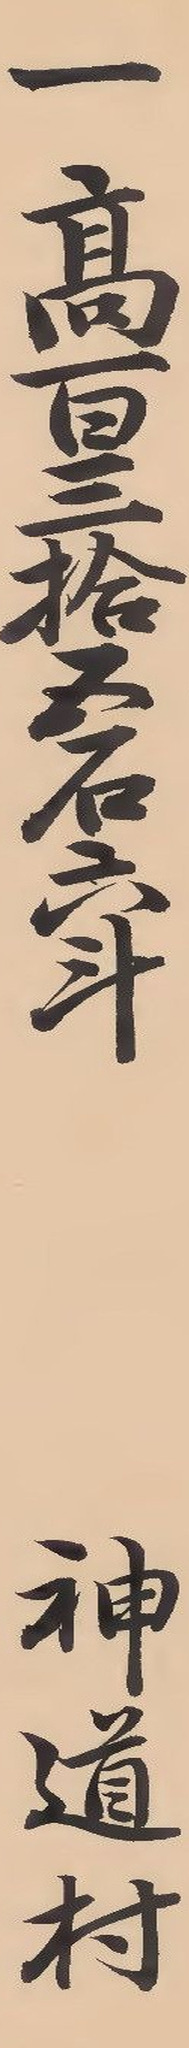一高百三拾五石六斗神道村
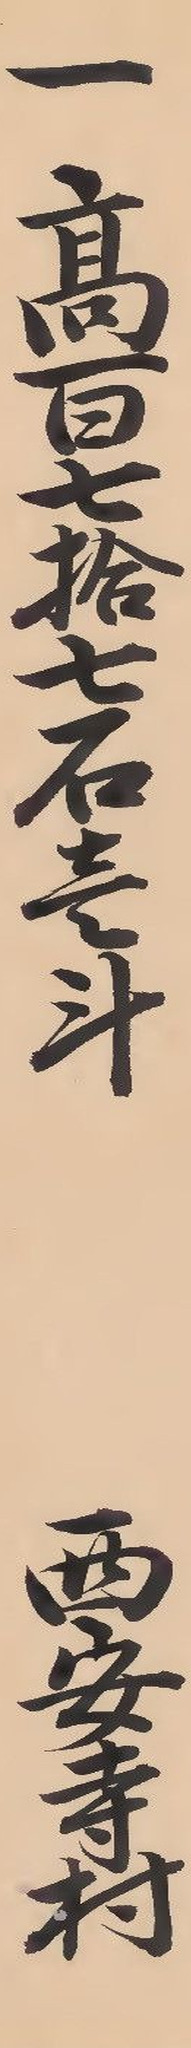一高百七拾七石壱斗西安寺村
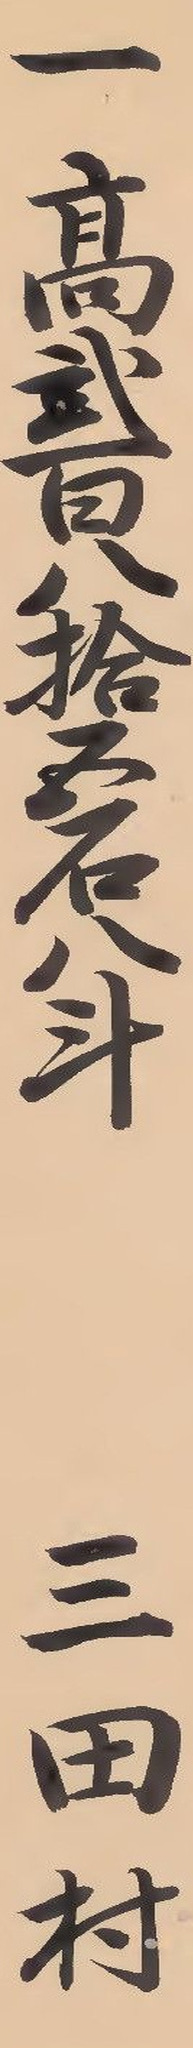一高弐百八拾五石八斗三田村
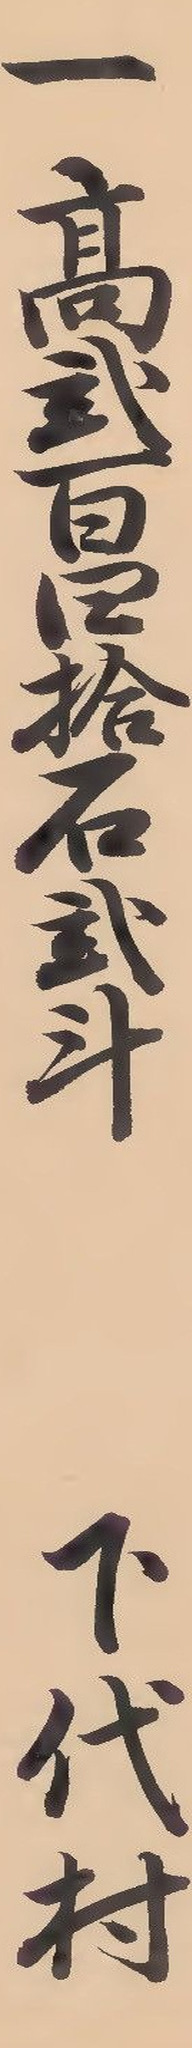一高弐百四拾石弐斗下代村

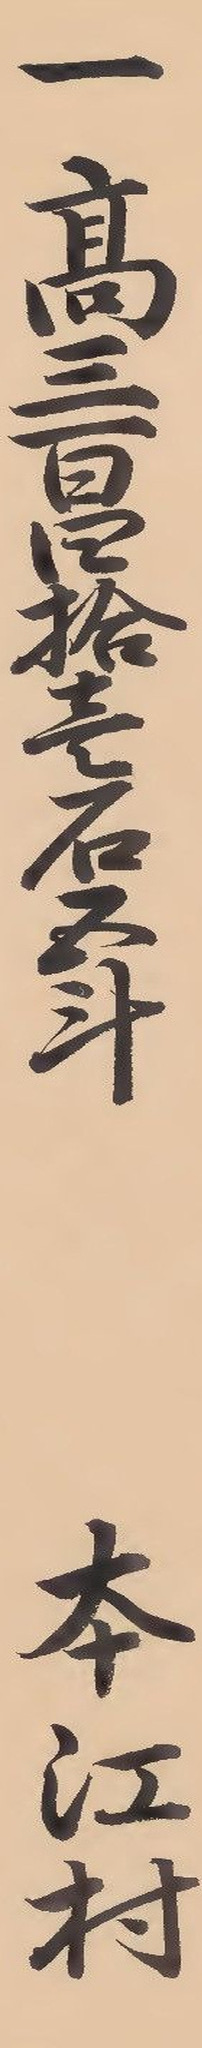一高三百四拾壱石五斗本江村
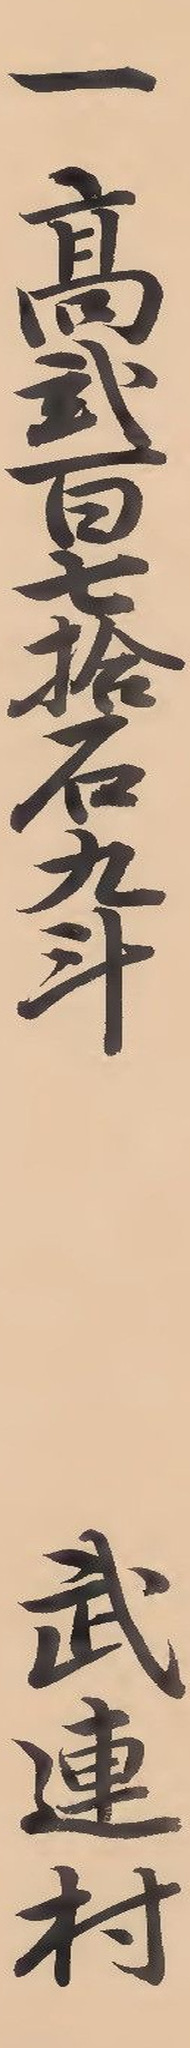一高弐百七拾石九斗武連村
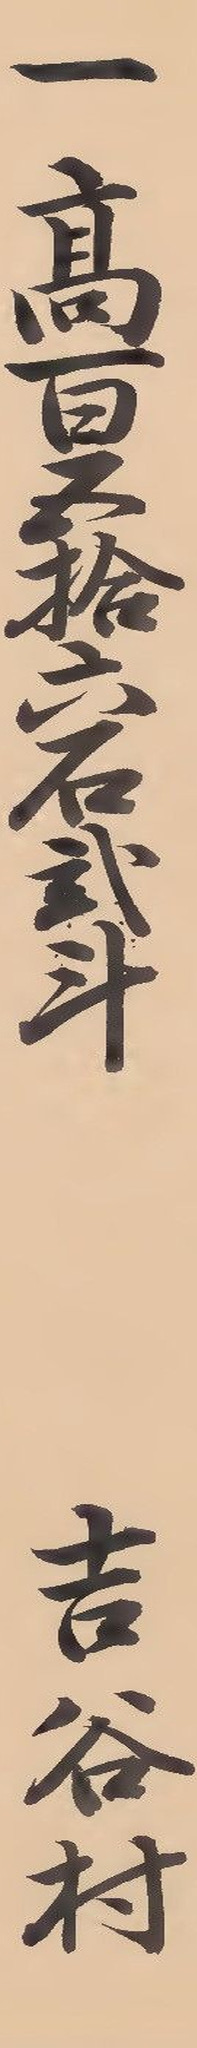一高百五拾六石弐斗吉谷村
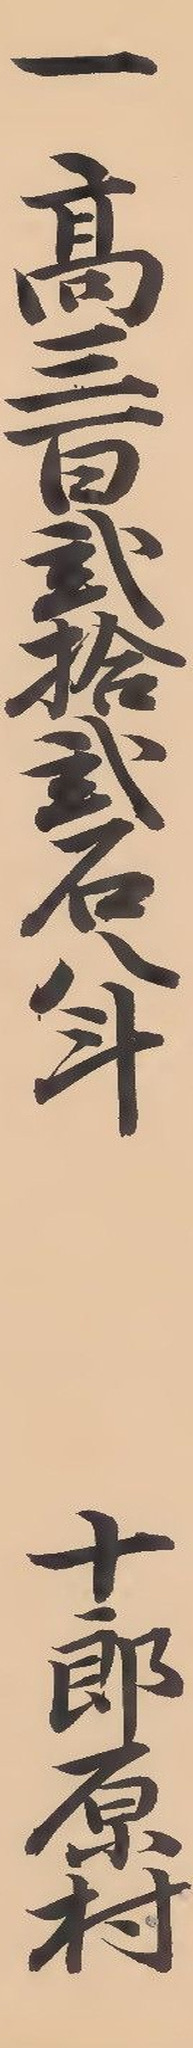一高三百弐拾弐石八斗十郎原村
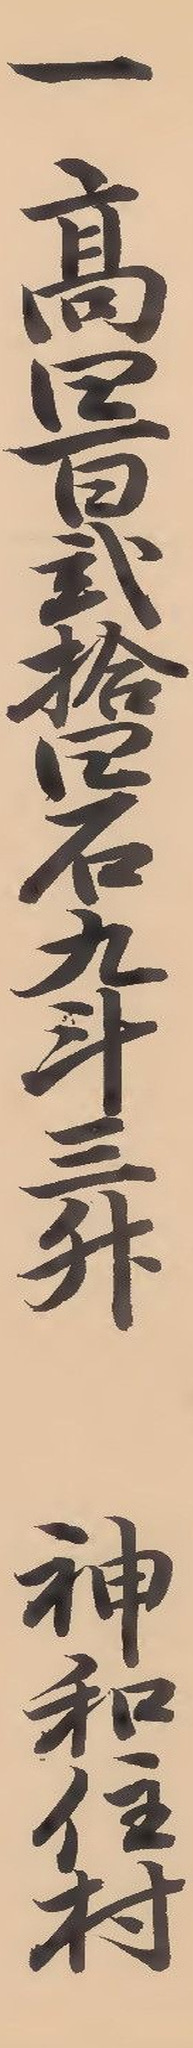一高四百弐拾四石九斗三升神和住村
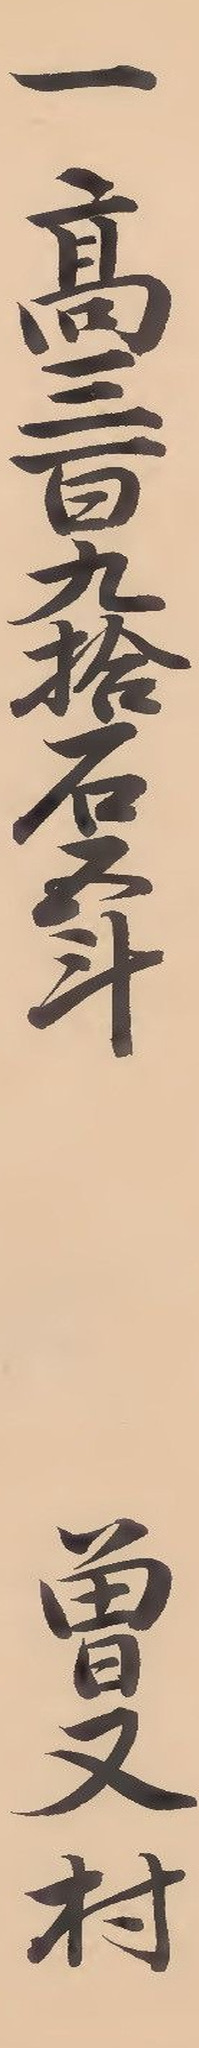一高三百九拾石五斗曽又村
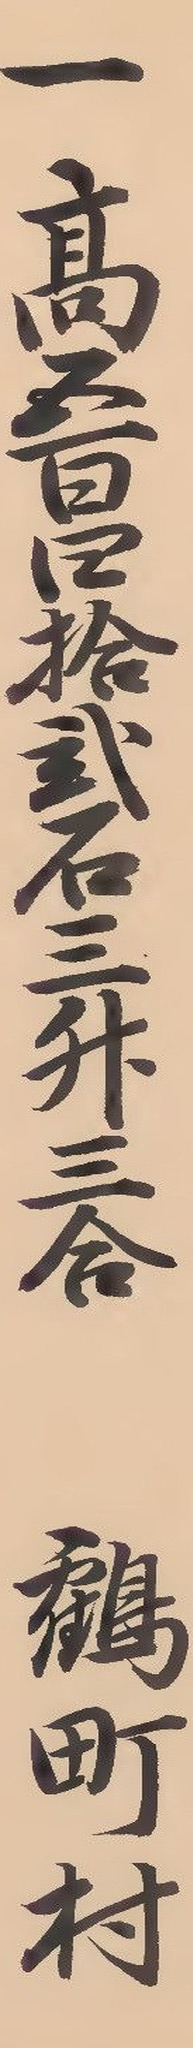一高五百四拾弐石三升三合鶴町村

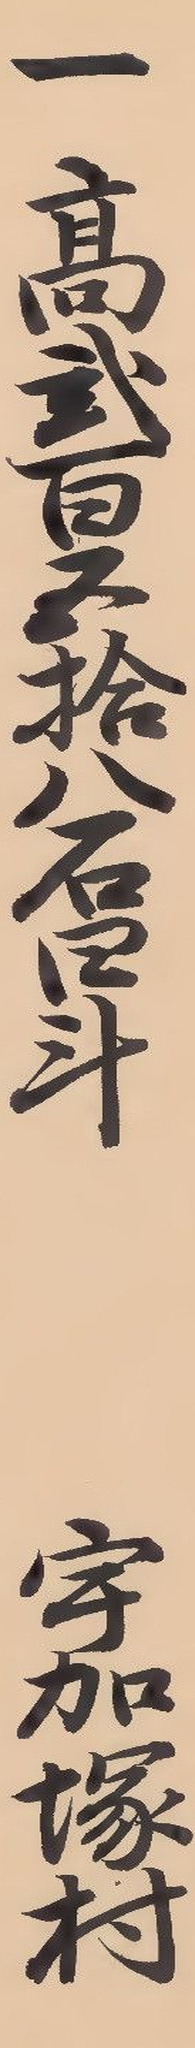一高弐百五拾八石四斗宇加塚村
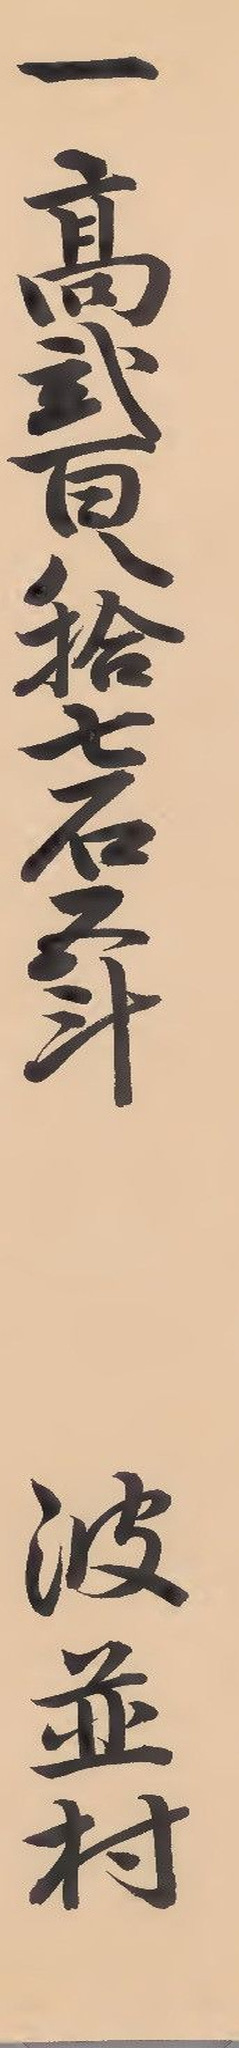一高弐百八拾七石五斗波並村
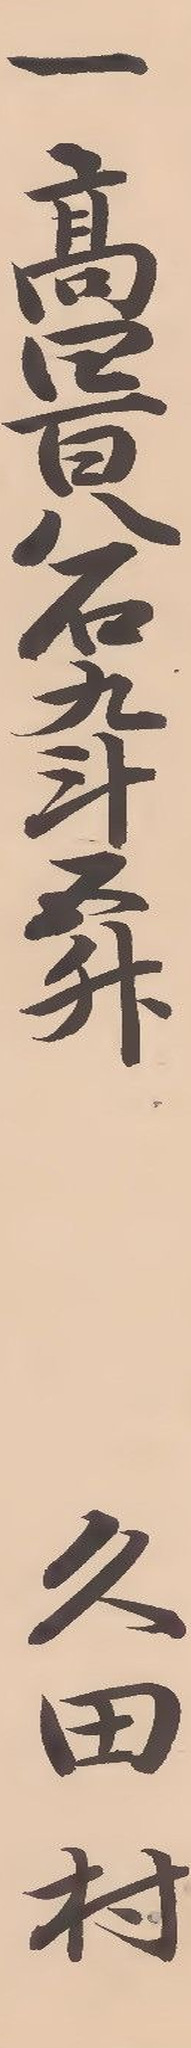一高四百八石九斗五升久田村
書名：能登国郷帳
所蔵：国立公文書館 National Archives of Japan
